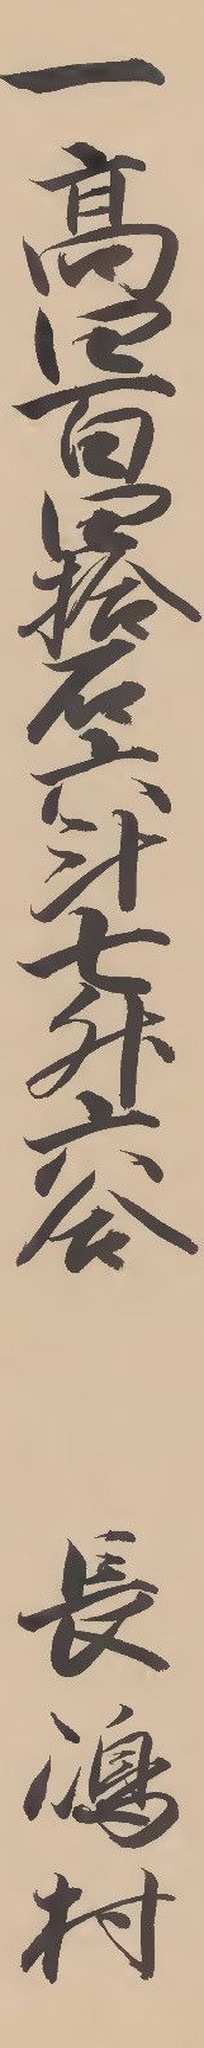一高四百四拾石六斗七升六合長島村
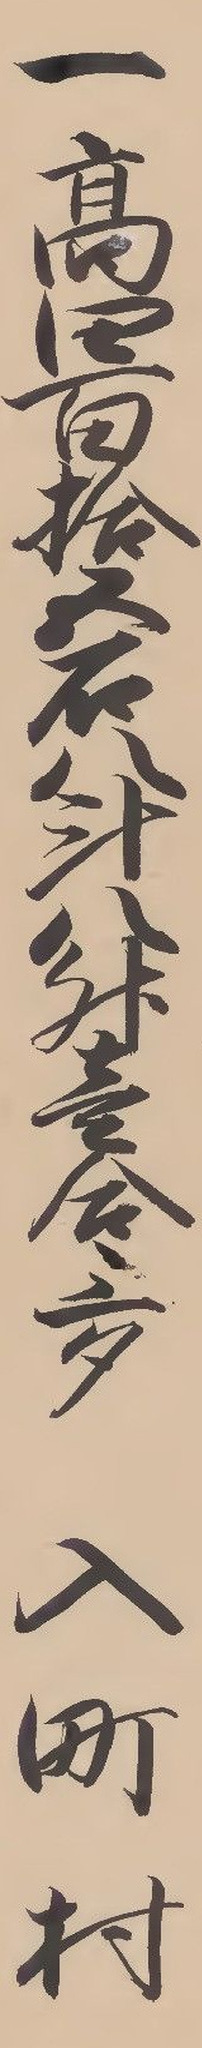一高四百拾五石八斗八升壱合三勺入町村

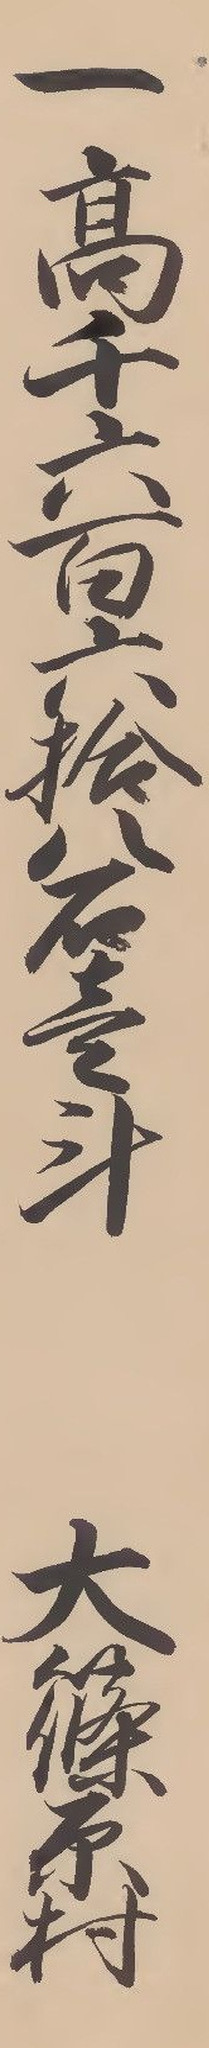一高千六百六拾八石壱斗大篠原村
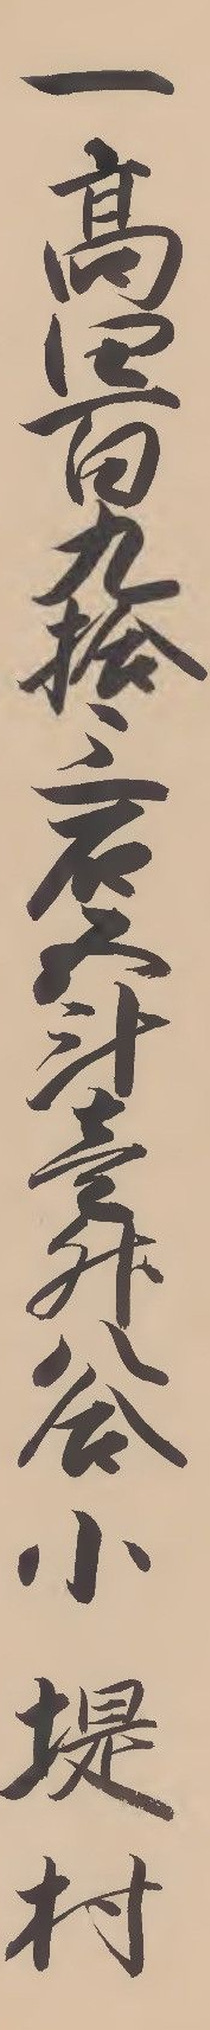一高四百九拾三石五斗壱升八合小堤村
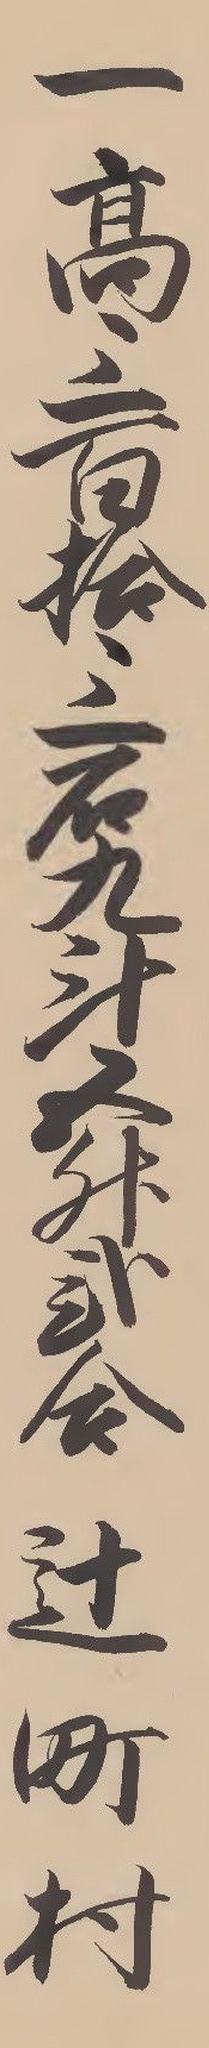一高三百拾三石九斗五升弐合辻町村
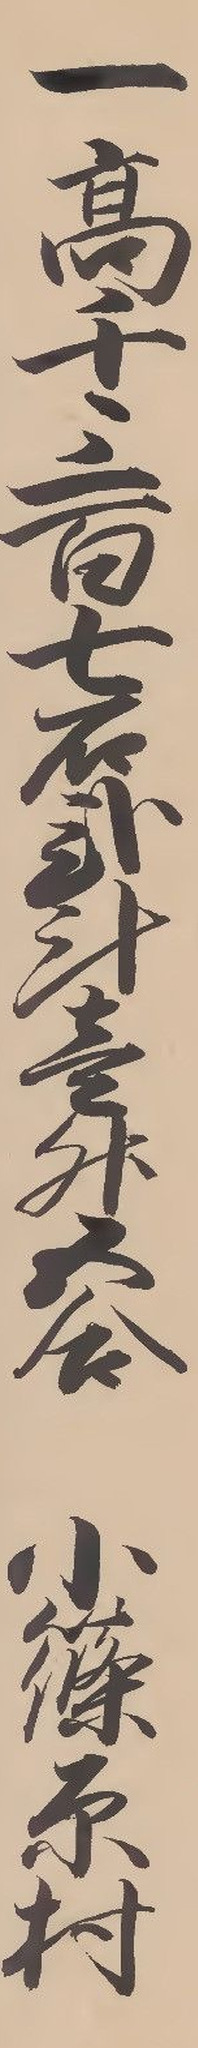一高千三百七石弐斗壱升五合小篠原村
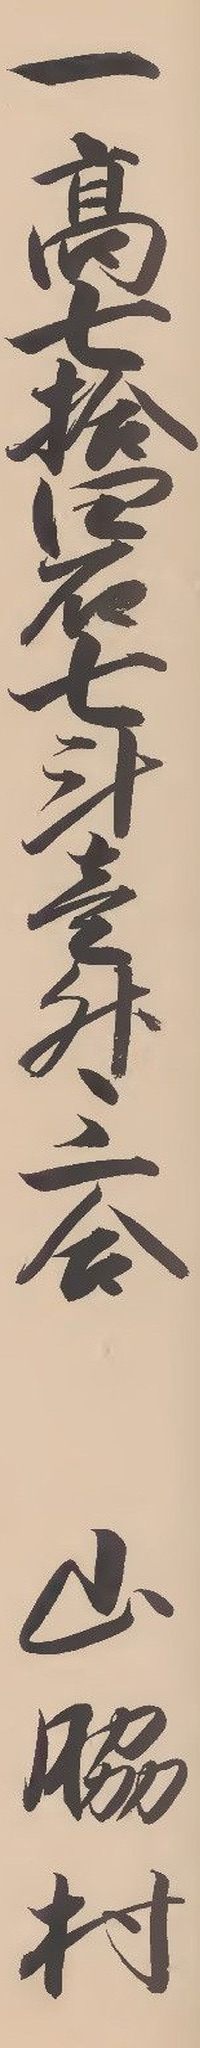一高七拾四石七斗壱升三合山脇村
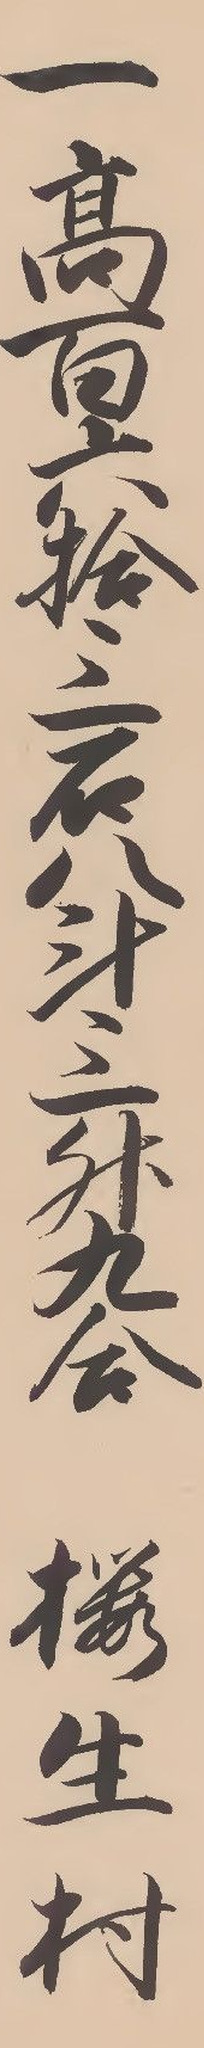一高百六拾三石八斗三升九合桜生村
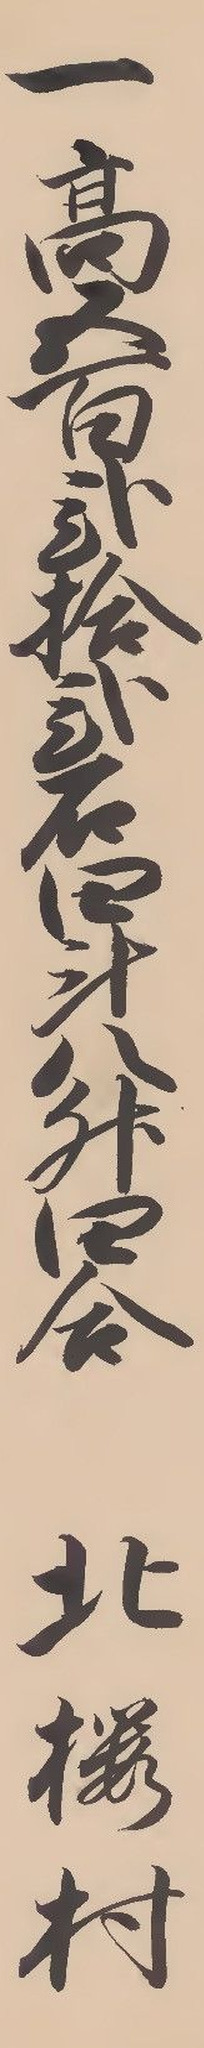一高五百弐拾弐石四斗八升四合北桜村
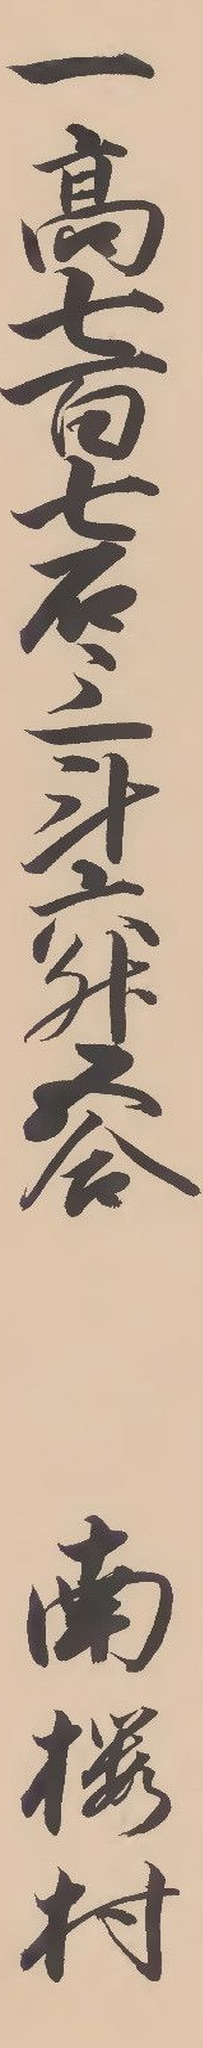一高七百七石三斗六升五合南桜村

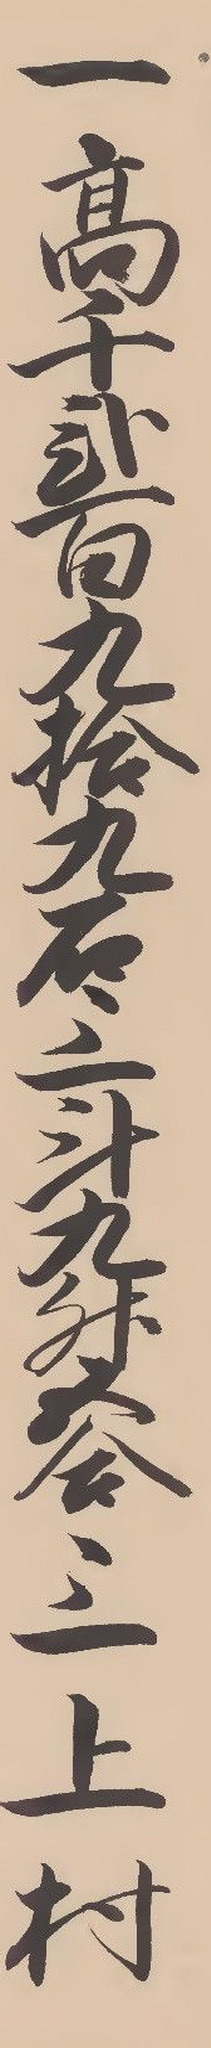一高千弐百九拾九石三斗九升五合三上村
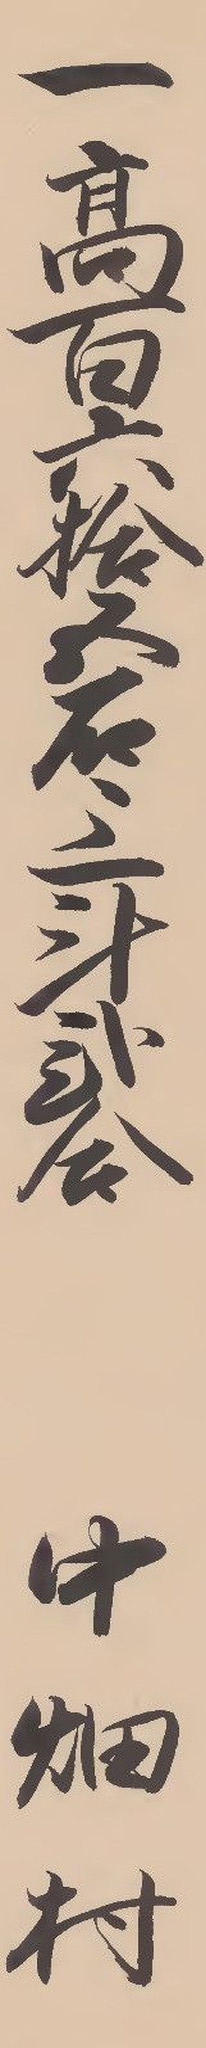一高百六拾五石三斗弐合中畑村
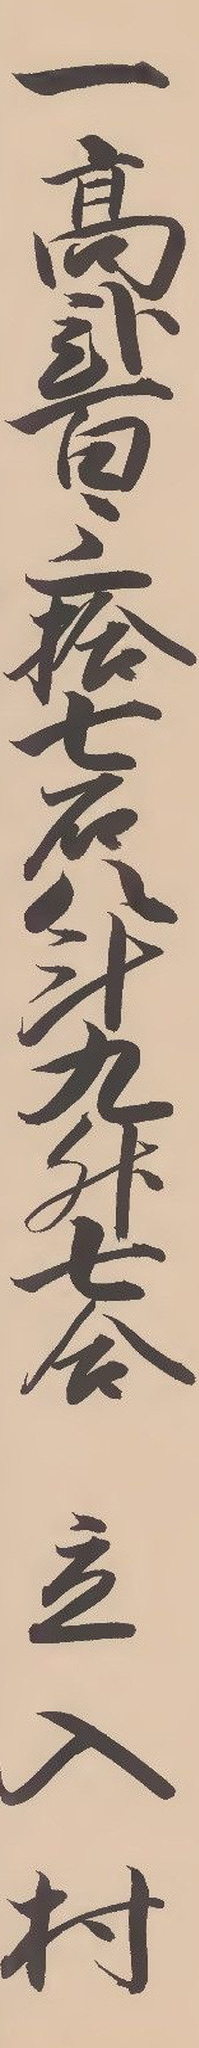一高弐百三拾七石八斗九升七合立入村
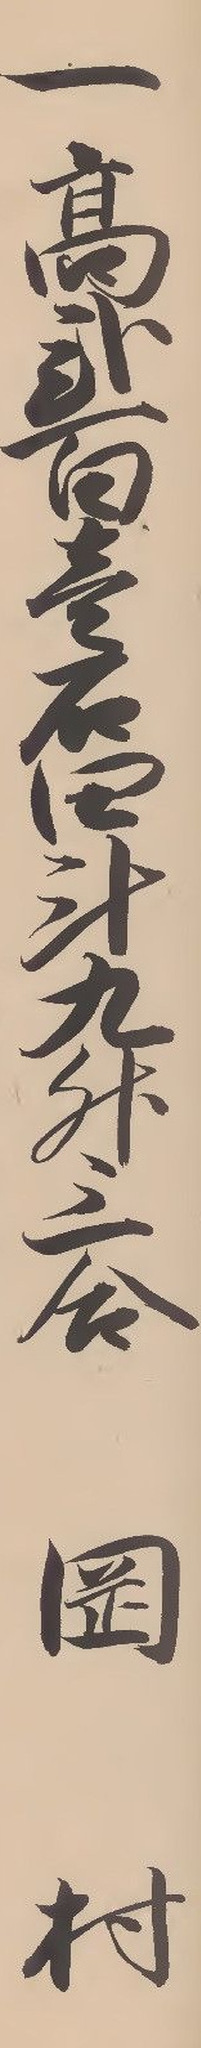一高弐百壱石四斗九升三合岡村
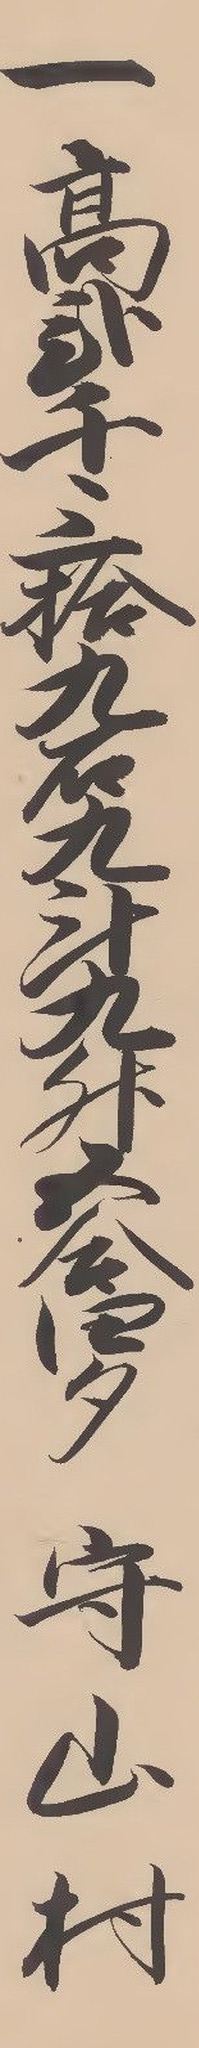一高弐千三拾九石九斗九升五合四勺守山村
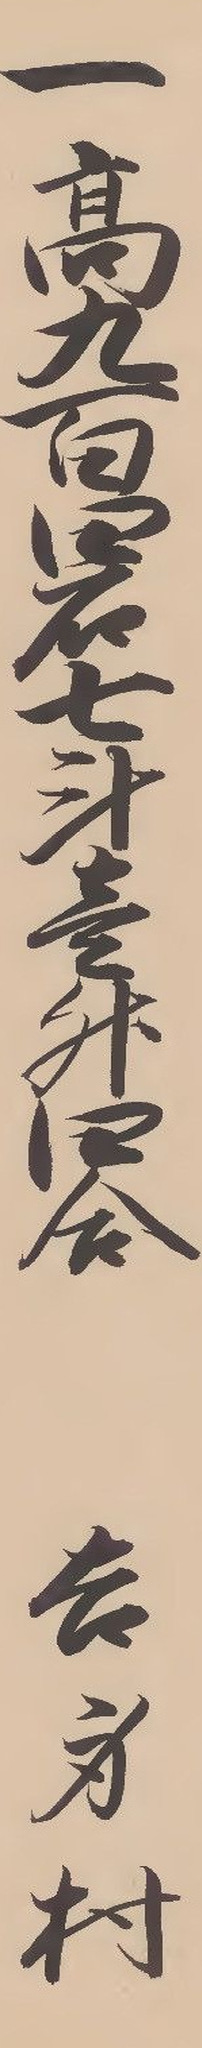一高九百四石七斗壱升四合吉身村
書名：近江国郷帳
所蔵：国立公文書館 National Archives of Japan
